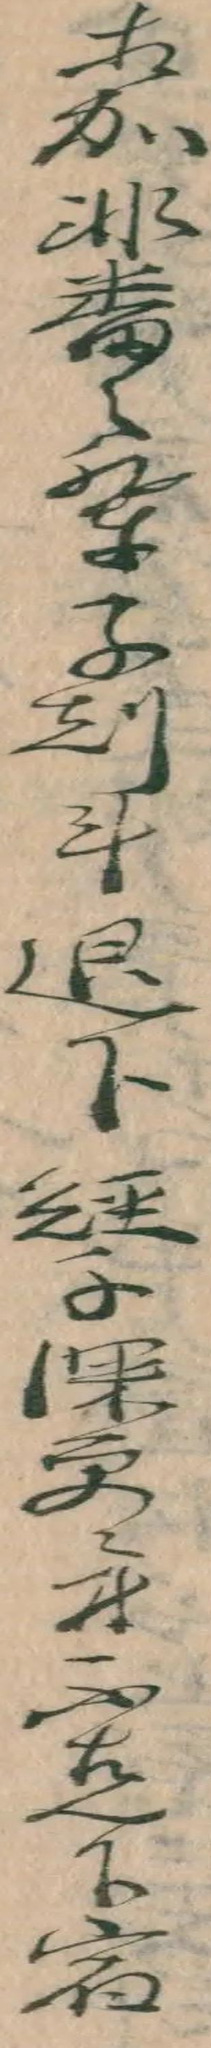相加非番之輩子刻斗退下経千深更ニ付不下宿
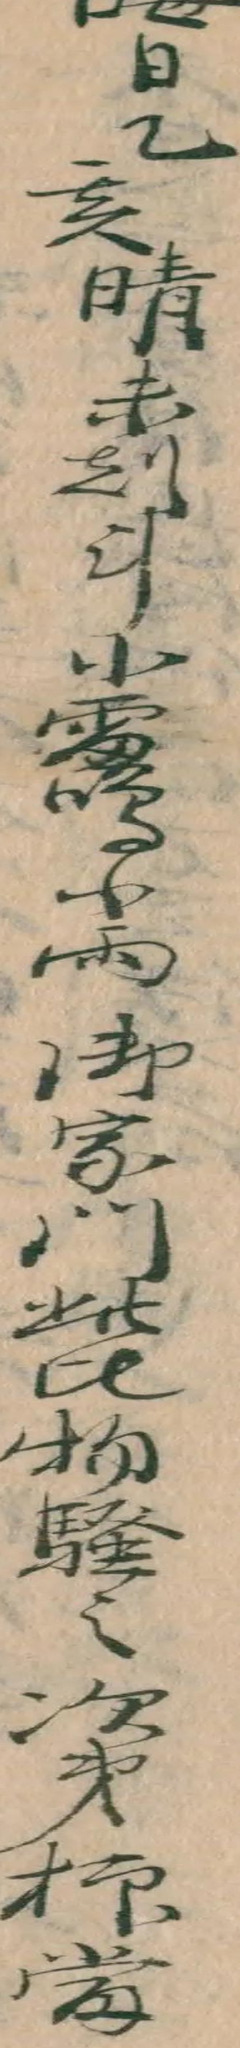晦日乙亥晴未刻斗小雷鳴小雨御家門此比物騒之次第抑當
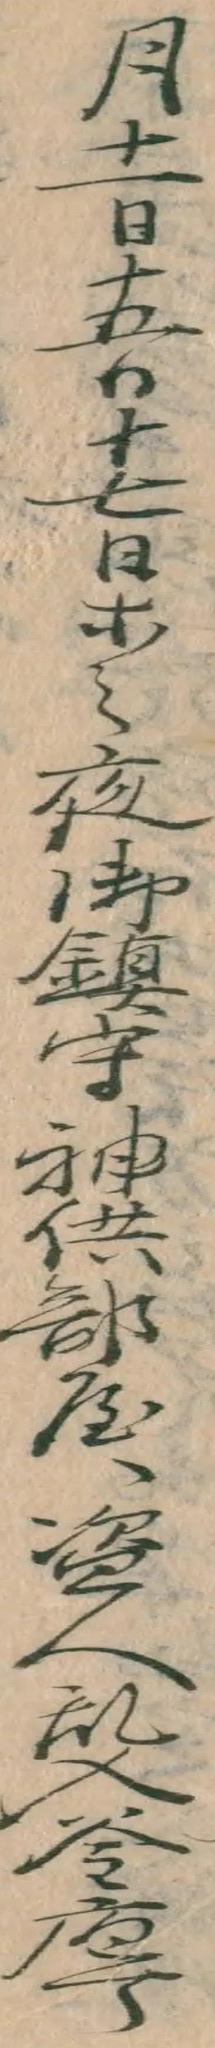月十一日十五日十七日等之夜御鎮守神供部屋へ盗人乱入令包丁
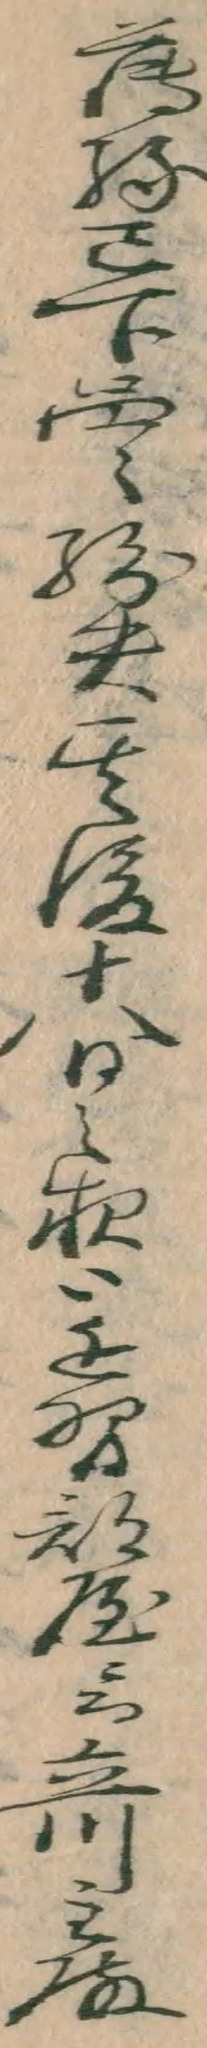薄縁已下品々紛失其後十八日之夜御近習部屋ニ而立川主殿
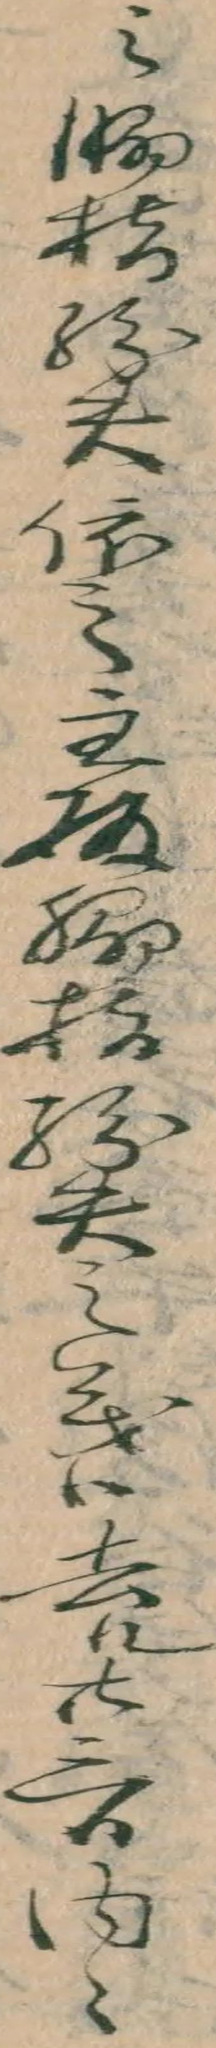之脇指紛失依之主殿脇指紛失之義は去ル廿三日内々
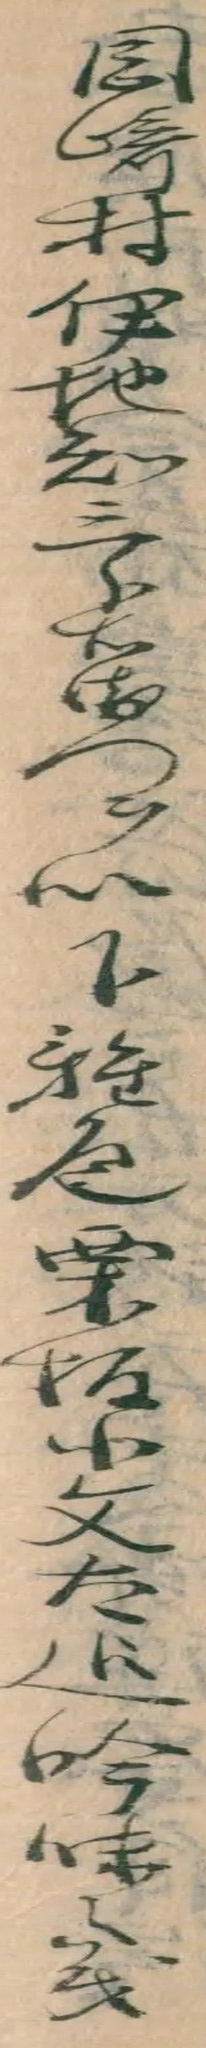岡崎村伊地知三郎右衛門ヲ以下雑色栗坂小文太迄吟味之義
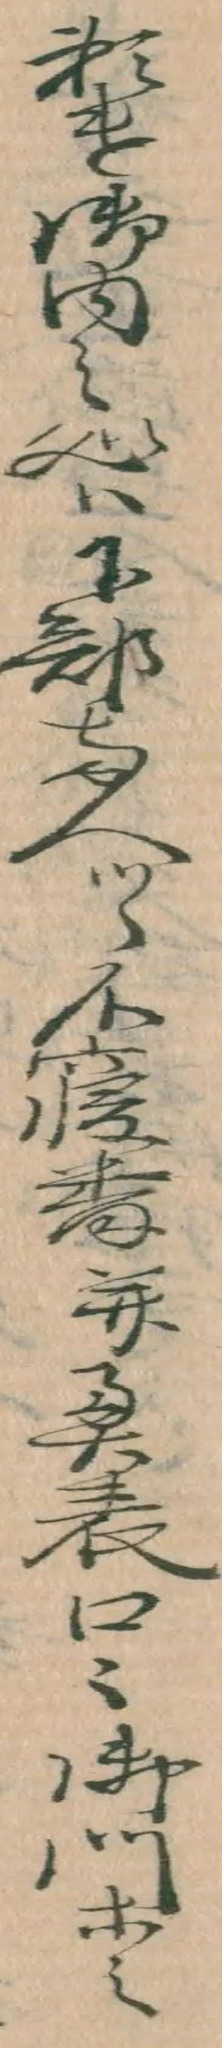頼遣御内之処ハ下部両人ツヽ不寝番并奥表口々御門等之
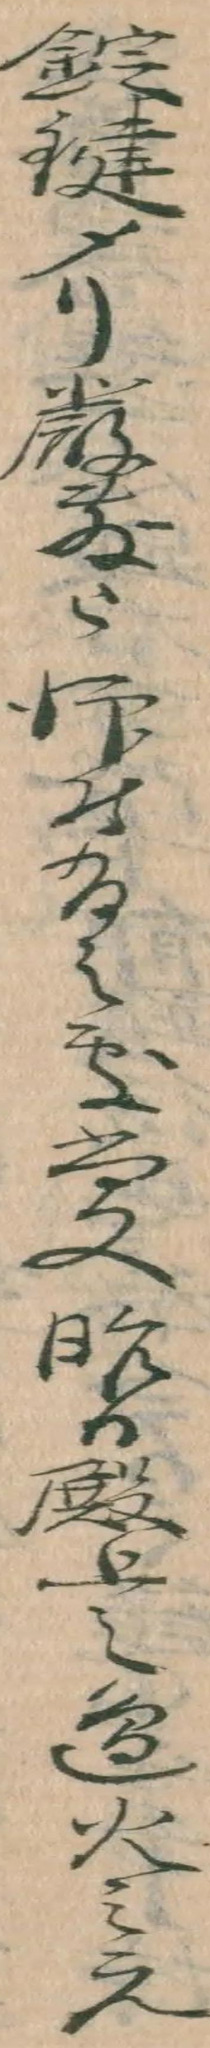錠鍵〆リ厳敷被仰付有之處尚又昨日殿上之辺火之元
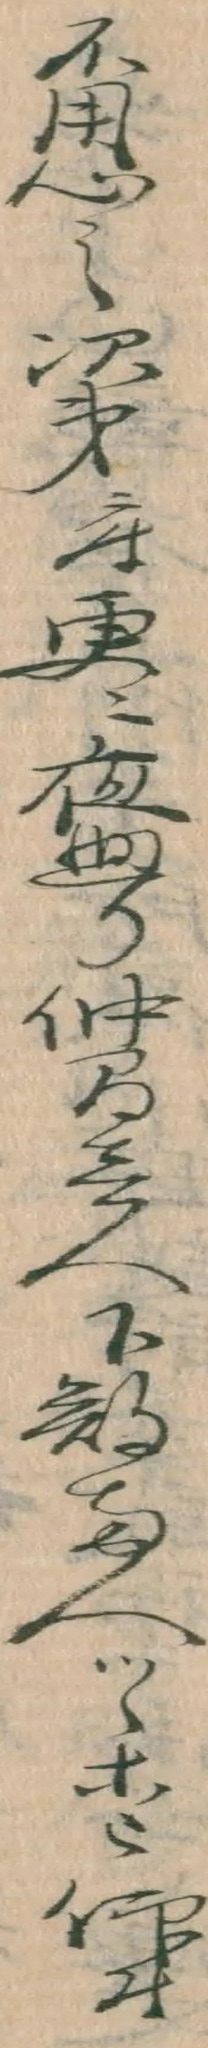不用心之次第ニ付更ニ夜廻り仲間壱人下部両人ツヽ等被仰付
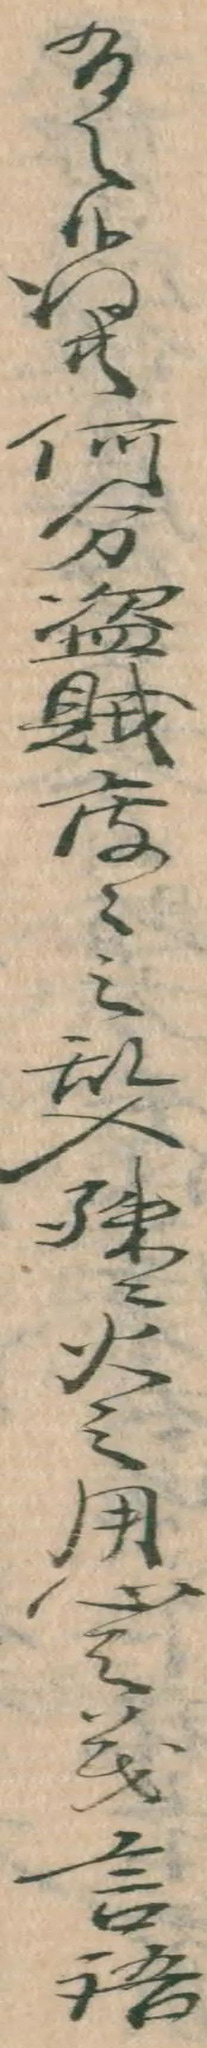有之候得共何分盗賊度々之乱入殊に火之用心之義言語
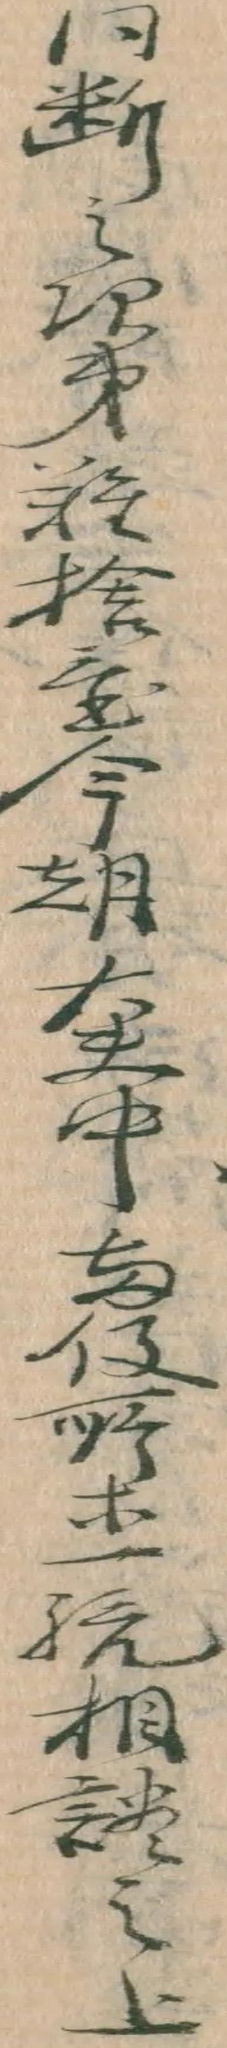同断之次第難捨置今朝大夫中両役所等一統相談之上
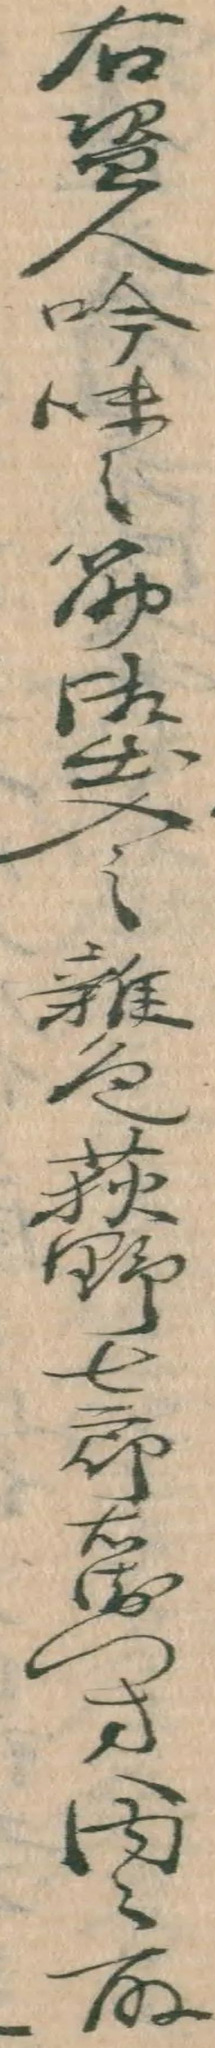右盗人吟味之筋御出入之雑色萩野七郎右衛門方へ内々取
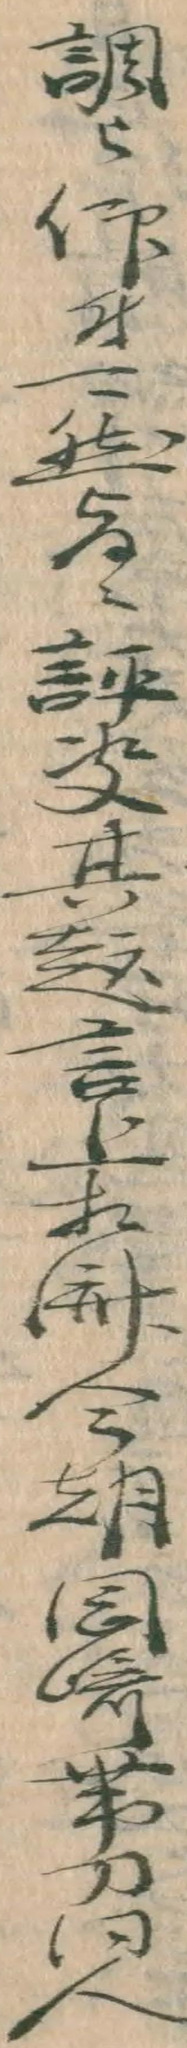調被仰付可然旨に評決其趣言上相済今朝岡崎帯刀同人
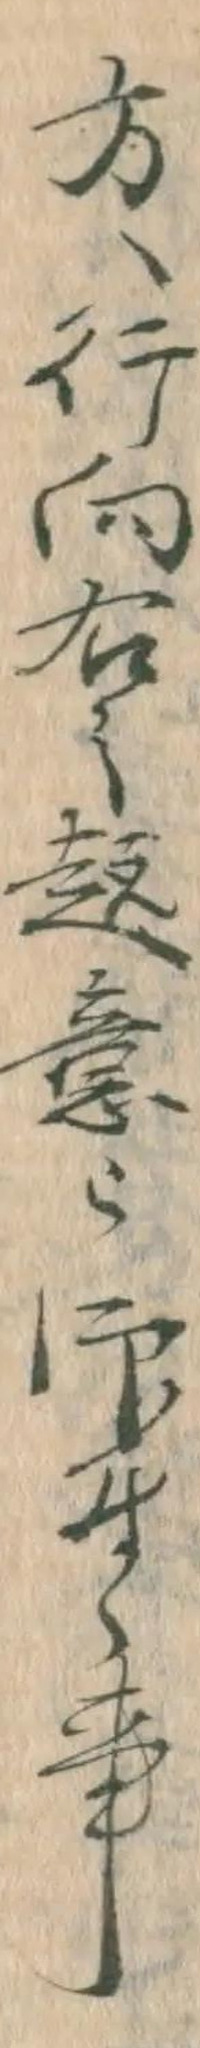方へ行向右之趣意被仰付候事
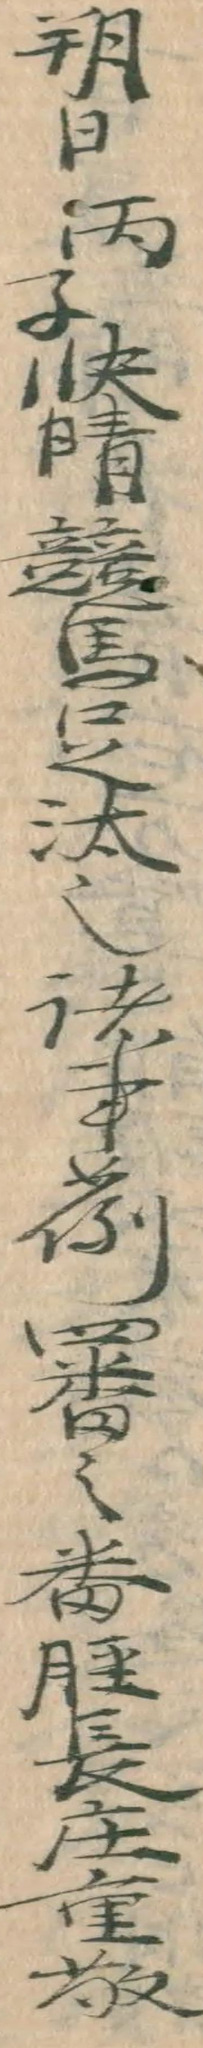朔日丙子快晴競馬足汰之也諸事如例四番之番脛長庄重敬
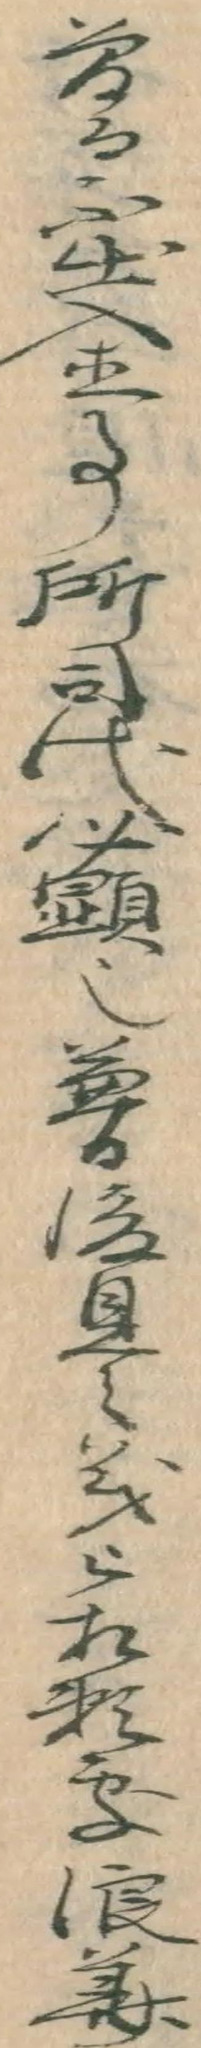曽而不出入直事所司代必顕也兼日後見之義被相頼候處浪華
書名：賀茂社記録. 第65冊
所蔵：国立国会図書館 National Diet Library, JAPAN
